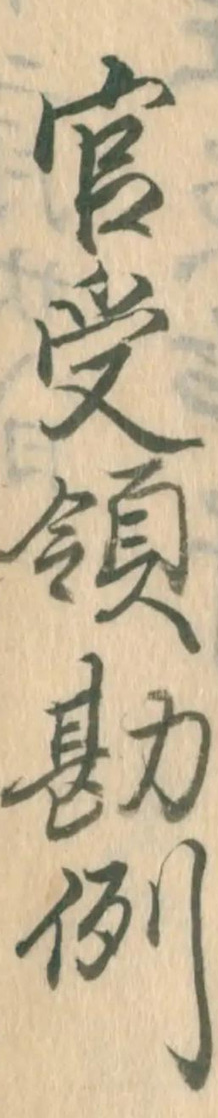官受領勘例

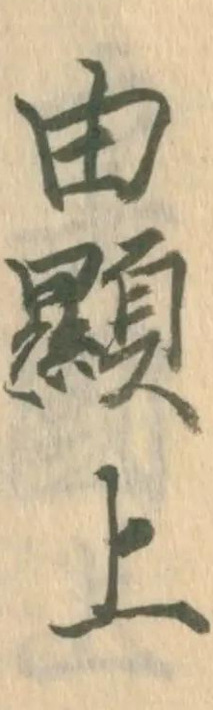由顕上
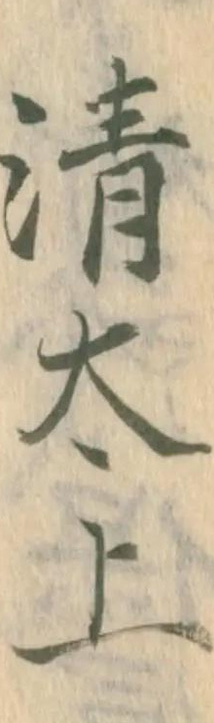清太上
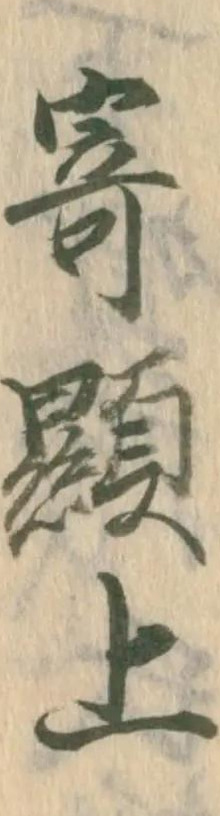寄顕上
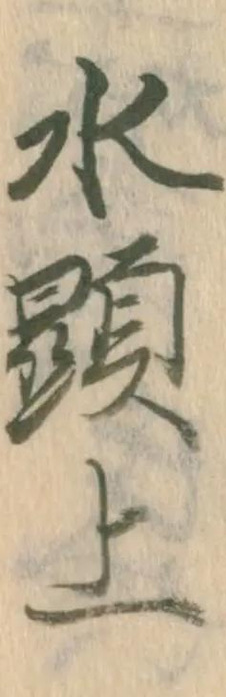水顕上
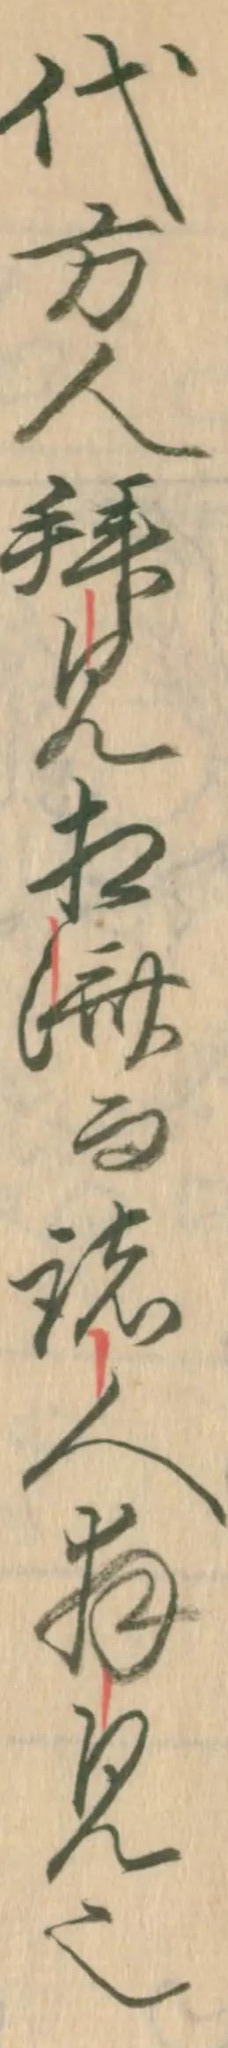代方人拝-見相_済而諸-人拝-見也

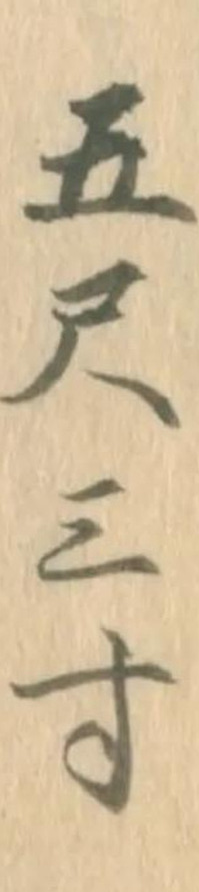五尺三寸
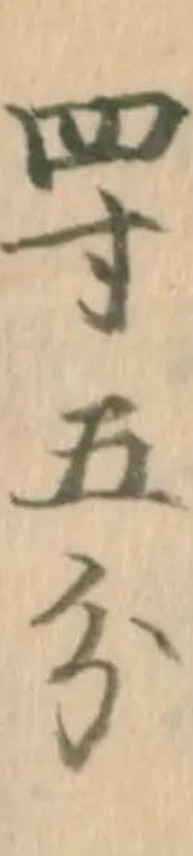四寸五分
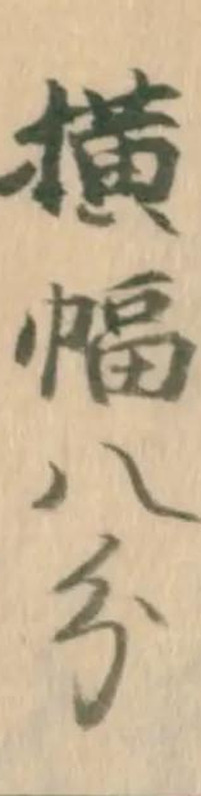横幅八分
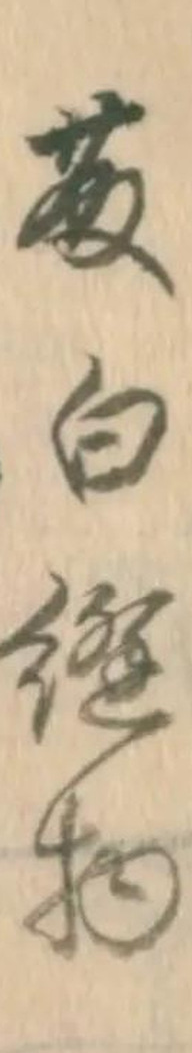藤白縫物

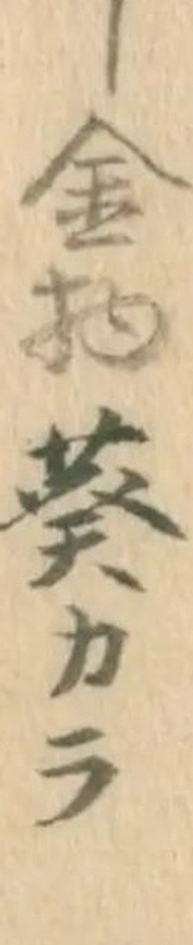金物葵カラ
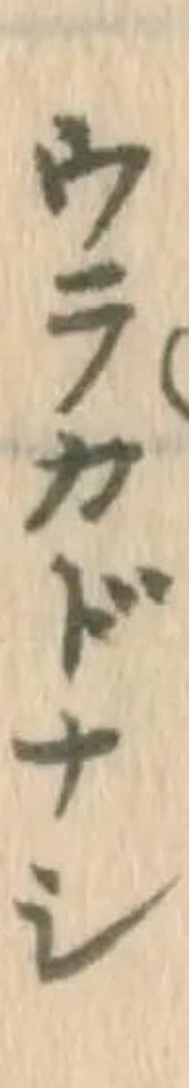ウラカドナシ

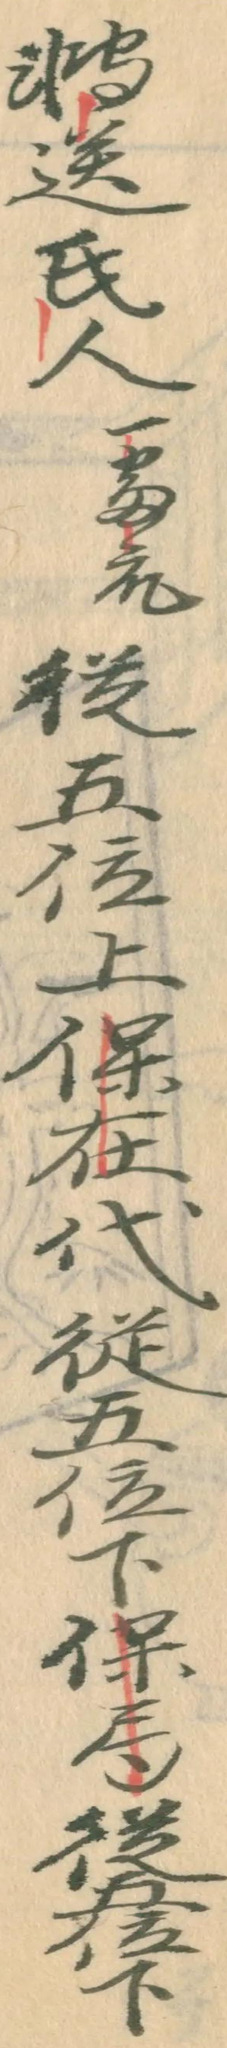転-送氏一-番-衆従五位上保在代従五位下保局従五位下
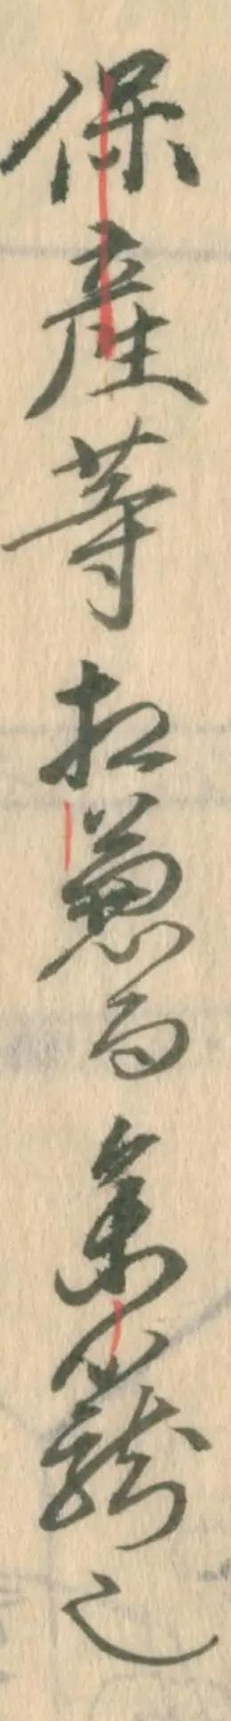保産等相_兼而参-籠也
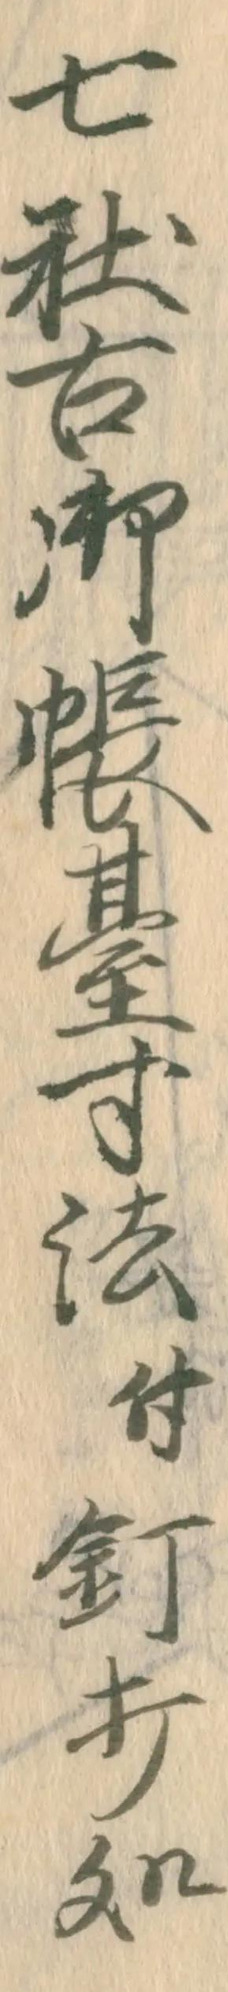七社古御帳台寸法付釘打処
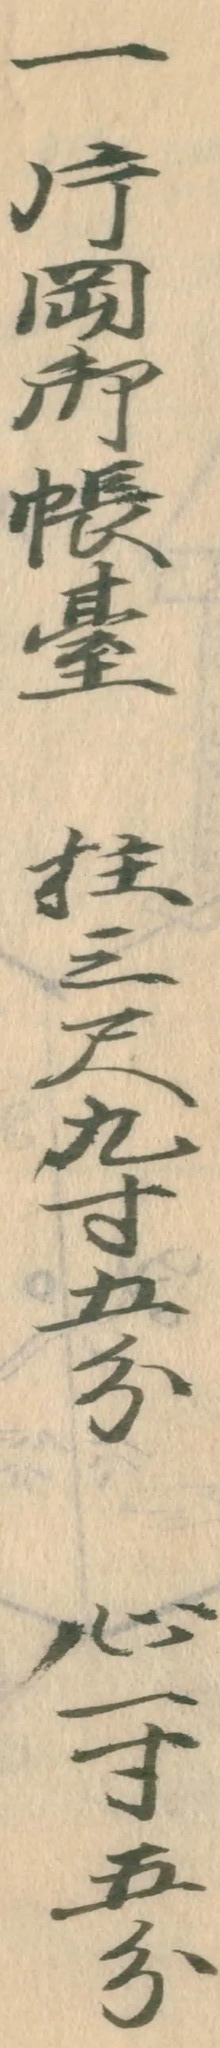一片岡御帳台柱三尺九寸五分心一寸五分
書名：賀茂社記録. 第16冊
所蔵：国立国会図書館 National Diet Library, JAPAN
